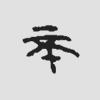不
